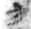方
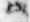四
